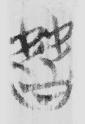朁
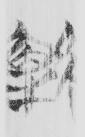{角牛糸}
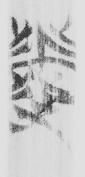發
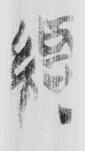紿
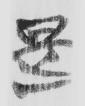是
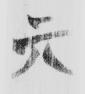亓
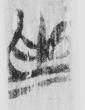爲
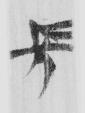長
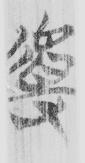虘B
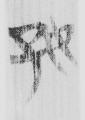好
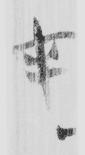才
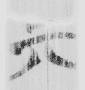亓
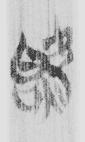{既火}
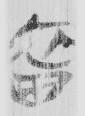{衣田}
